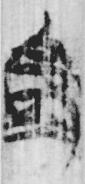命
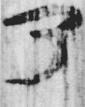乃
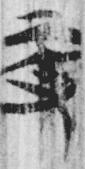○（辨）
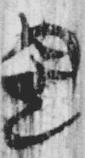侌（陰）
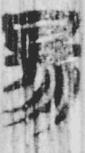昜（陽）
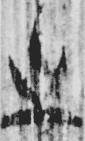之
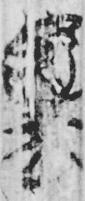○（氣）
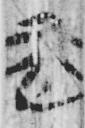而
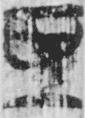聖（聽）
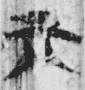亓（其）
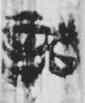訟
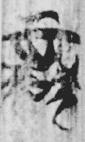獄
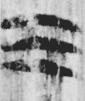三
